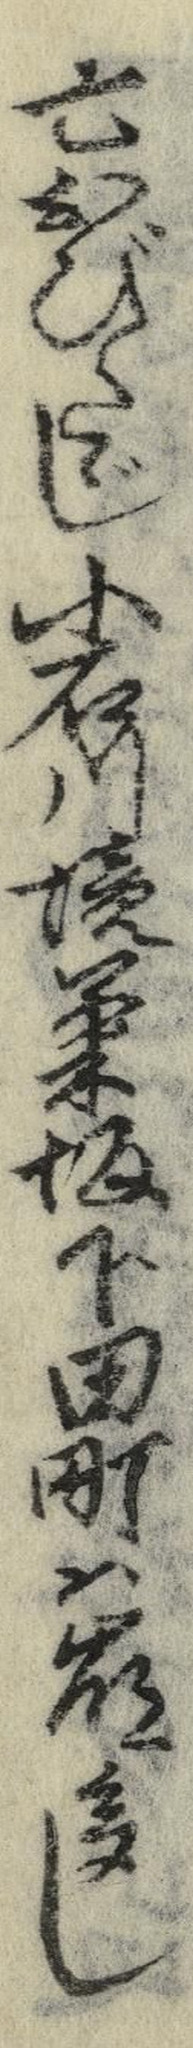亡おびたゞし小石川境菊坂下田町は崩多し
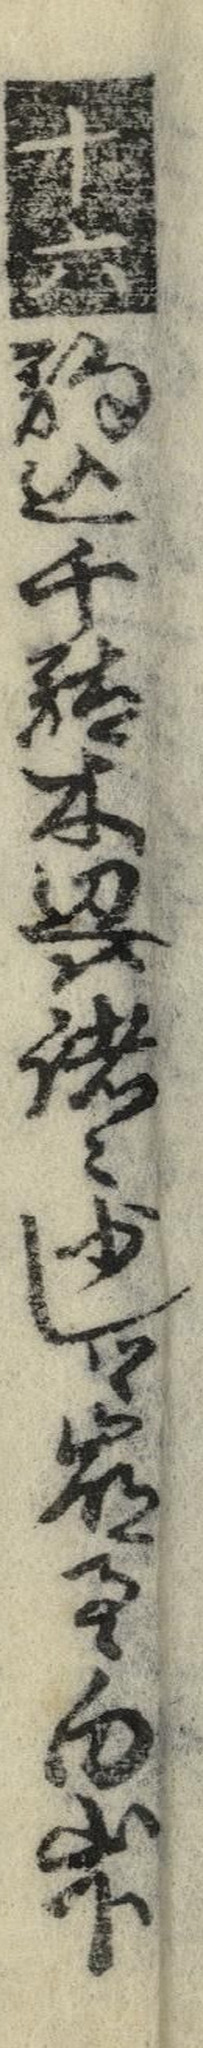十六駒込千駄木辺は諸々少しつゝ崩るゝ白山下
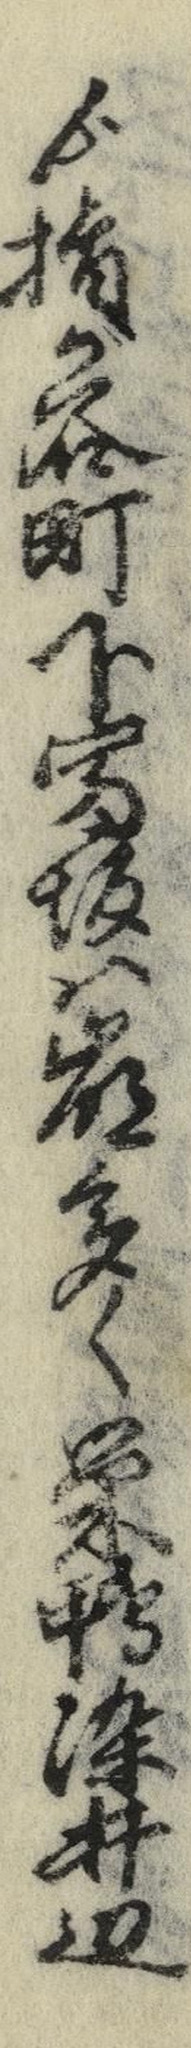ゟ指か谷町下富坂は崩多く巣鴨染井辺
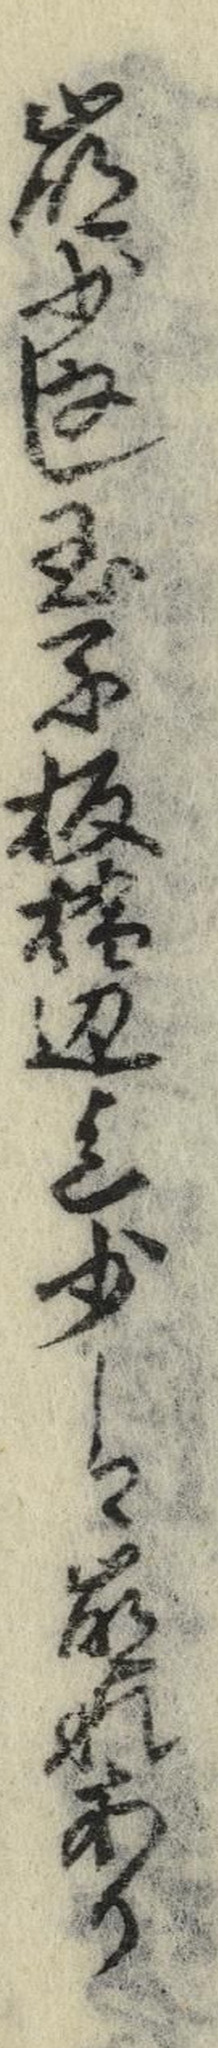崩少なし王子板橋辺迄少しつゝ崩れあり
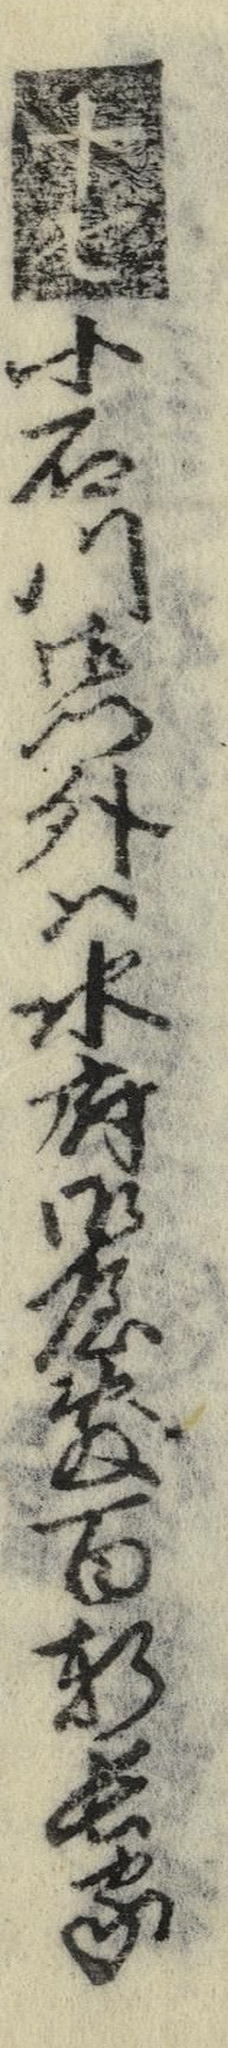十七小石川御門外は水府御屋敷百軒長家
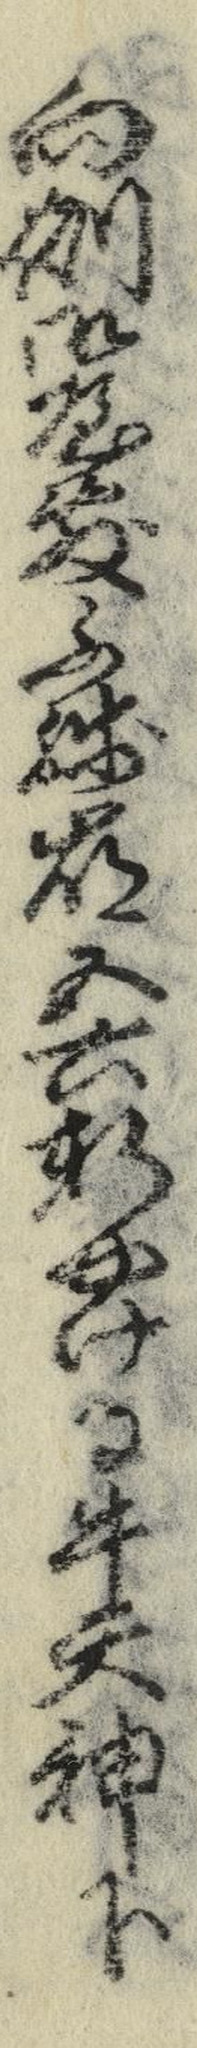向側御屋敷不残崩五六軒やける牛天神下
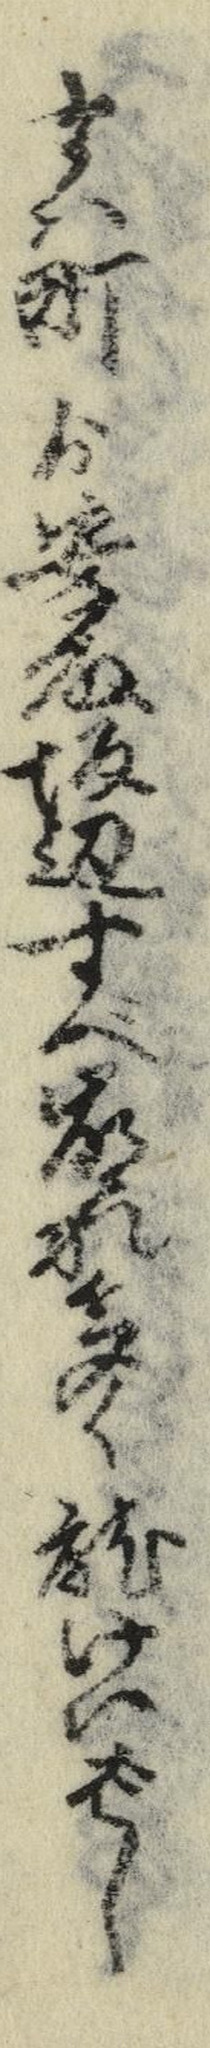すは町ゟ安藤坂辺すべ崩れ多く龍けいばし
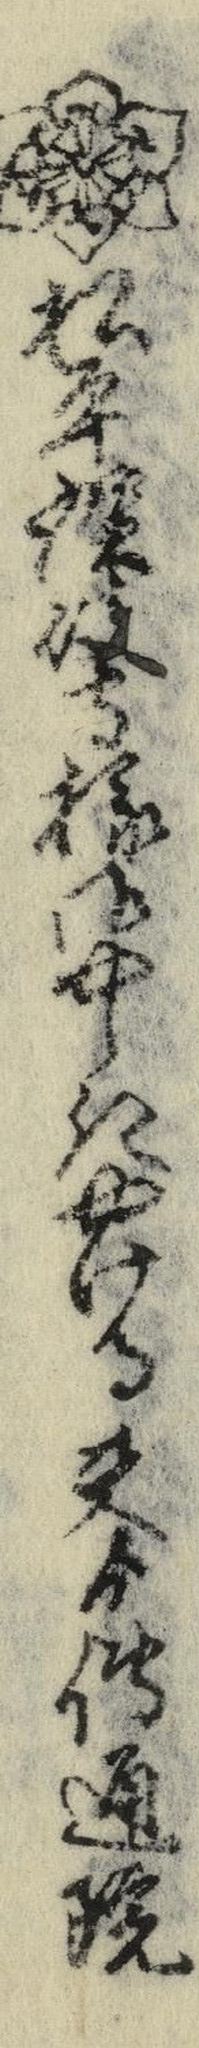松平讃岐守様御やしきやける夫ゟ伝通院
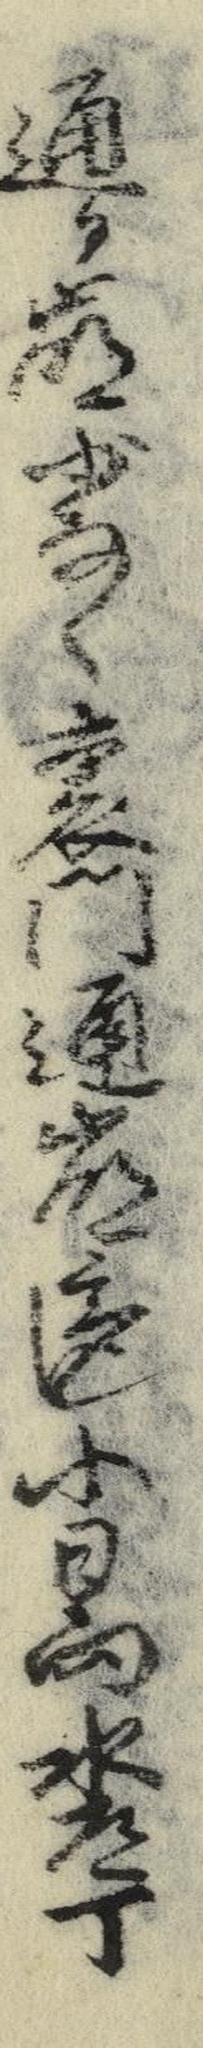通り崩すくなく裏門通崩多し小日向水屋丁
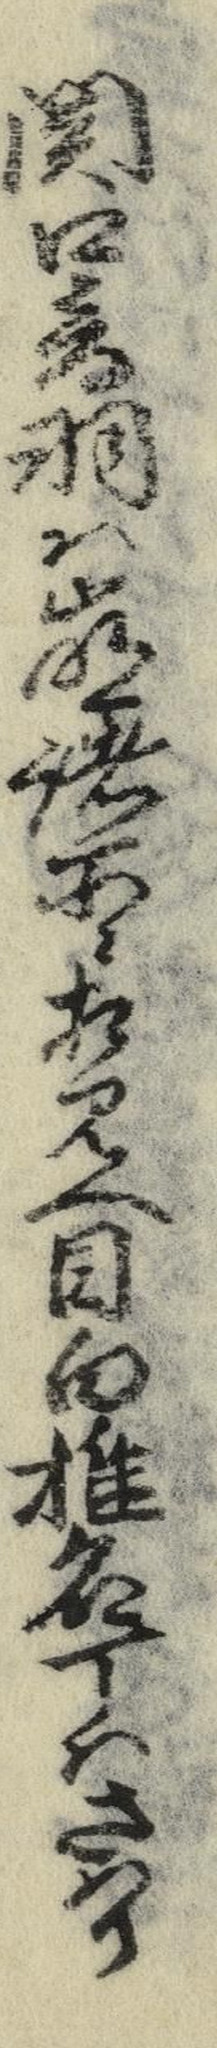関口音羽は崩諸所々相見へ目白椎名丁はさはり
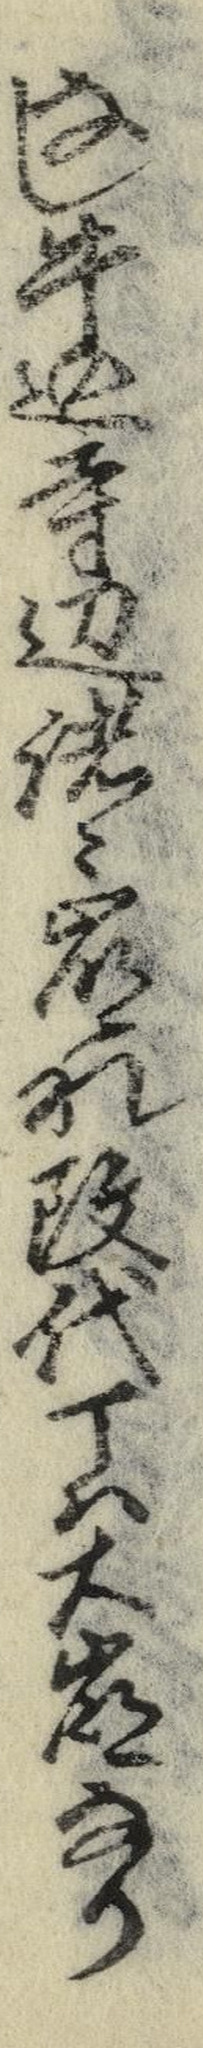なし牛込寺辺諸々崩れ改代丁は大崩なり
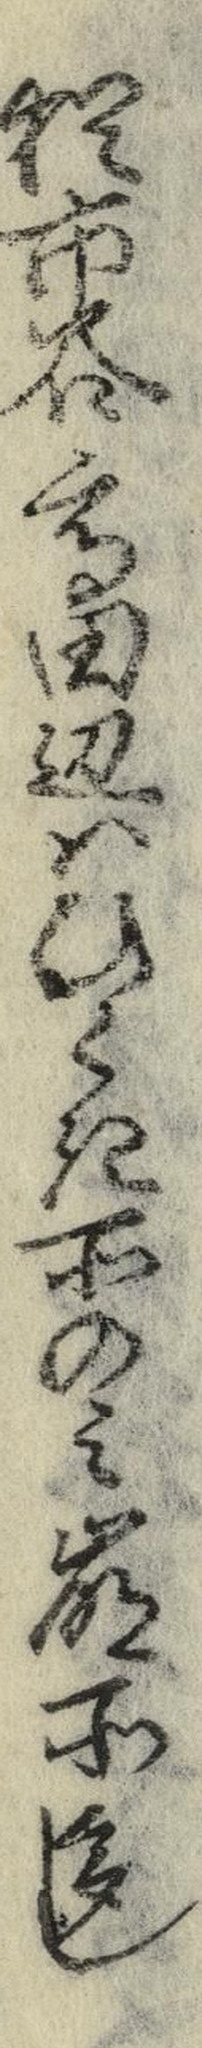猶市谷高田辺はひくき所のみ崩所多し
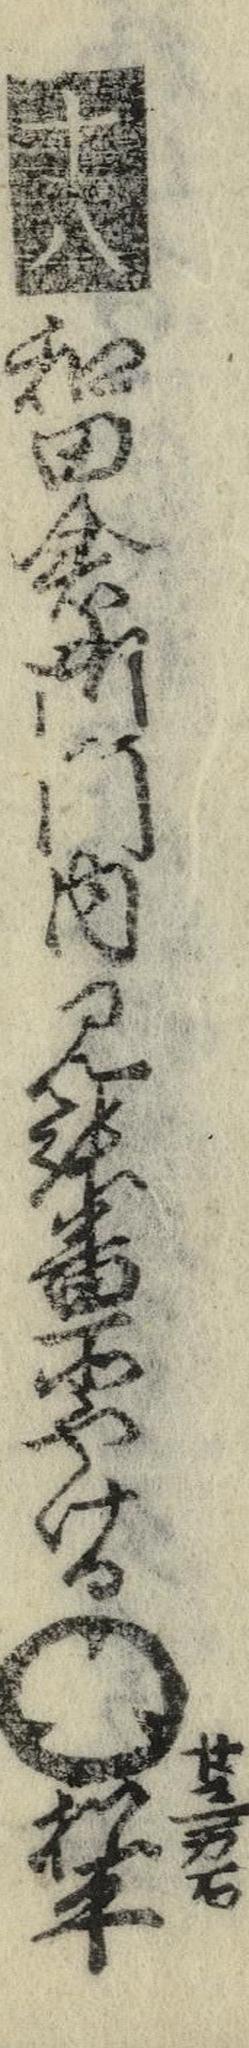十八和田倉御門内見張番所やける松平
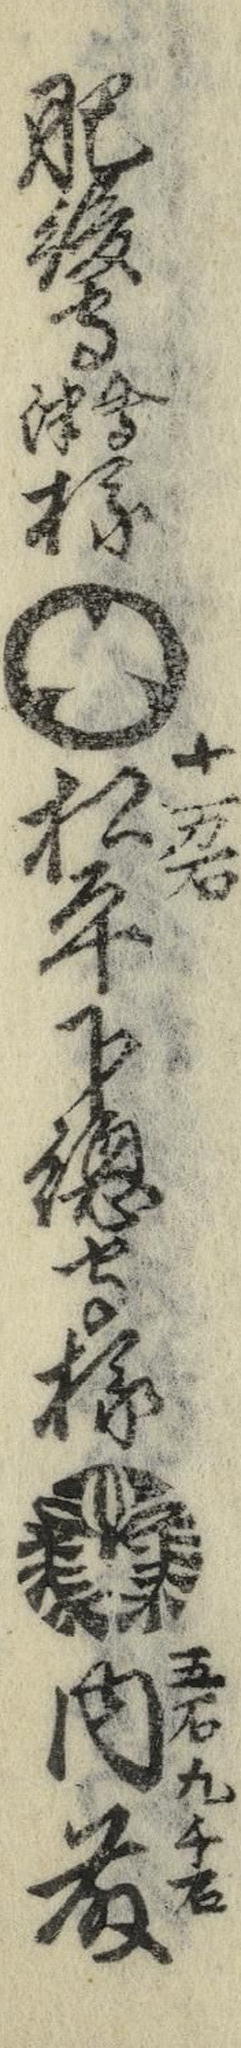肥後守會津様松平下總守様内藤

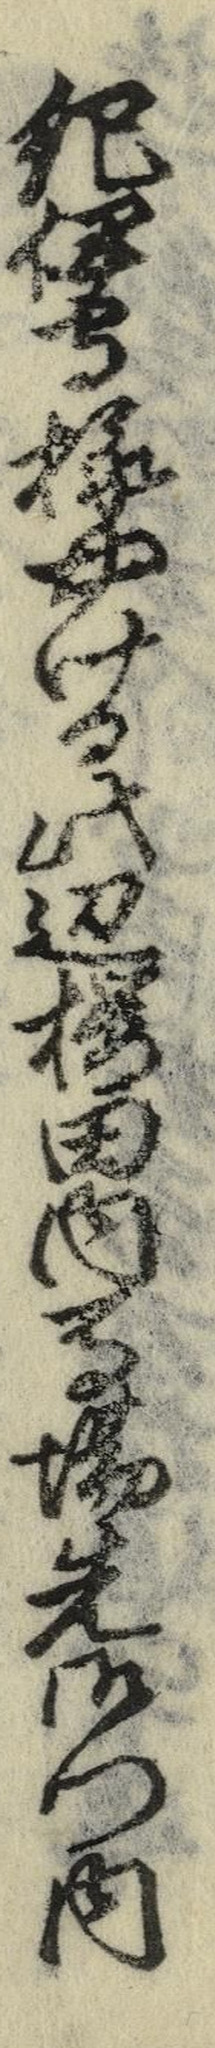紀伊守様やける此辺桜田門馬場先御門内
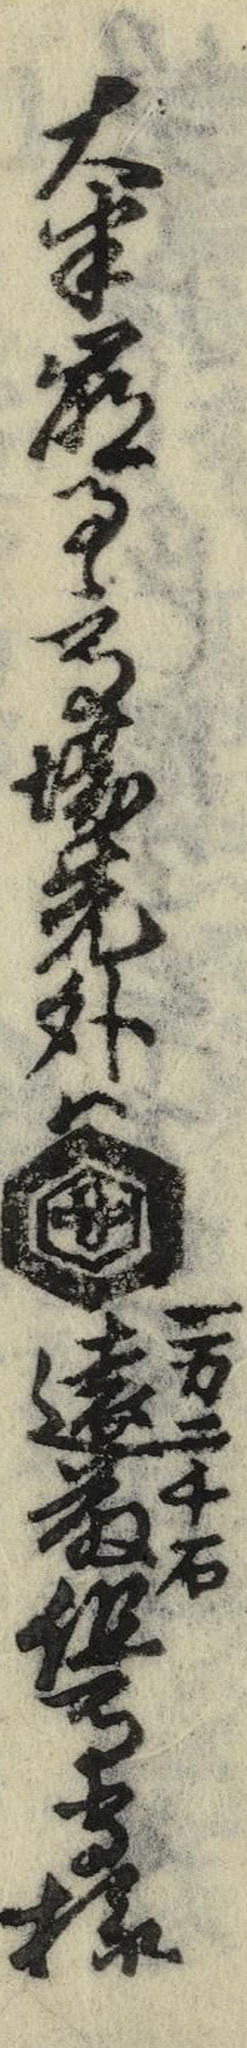大半崩るゝ馬場先外は遠藤但馬守様
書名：地震類焼場所明細書之写　安政二卯年十月二日夜四ツ時過　御府内御屋敷方市中共、并街道筋近郷聞書
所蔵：東京大学地震研究所図書室 Earthquake Research Institute Library, The University of Tokyo, JAPAN
